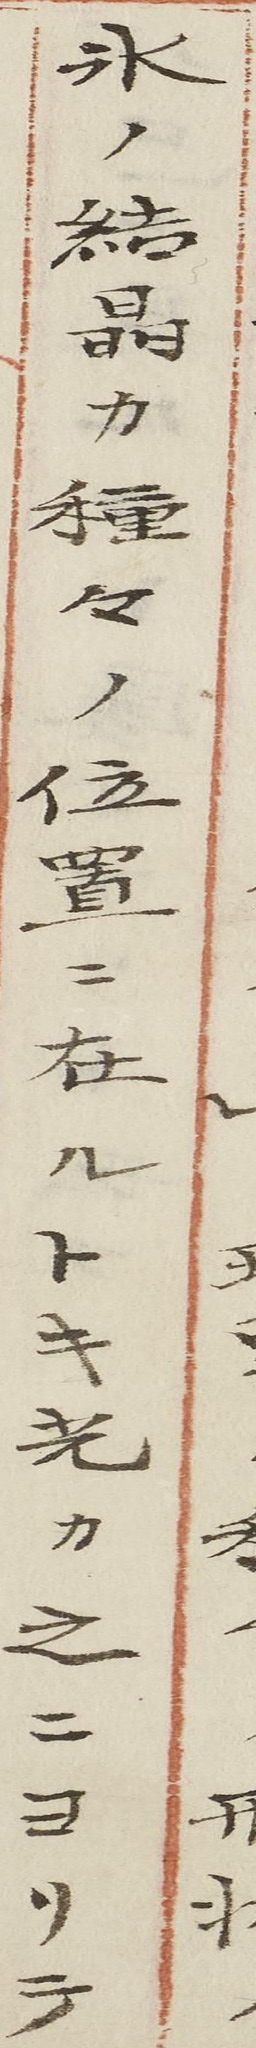氷ノ結晶カ種々ノ位置ニ在ルトキ光カ之ニヨリテ
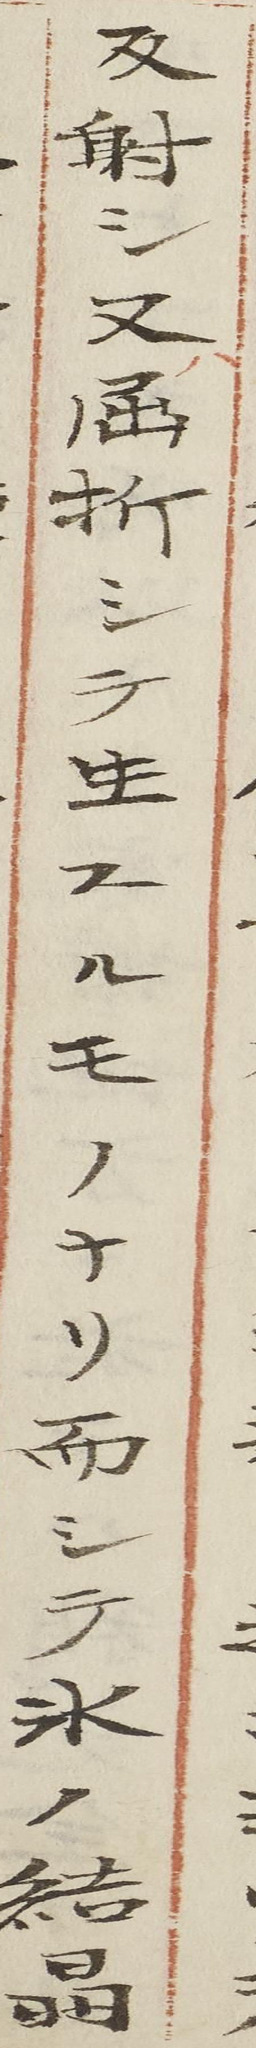反射シ又ハ屈折シテ生スルモノナリ而シテ氷ノ結晶
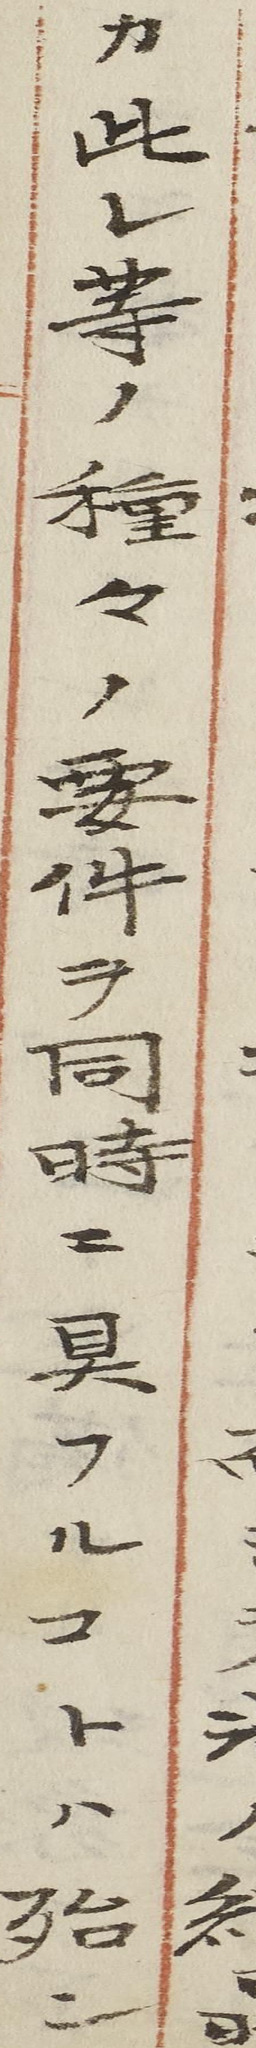カ此レ等ノ種々ノ要件ヲ同時ニ具フルコトハ殆ン

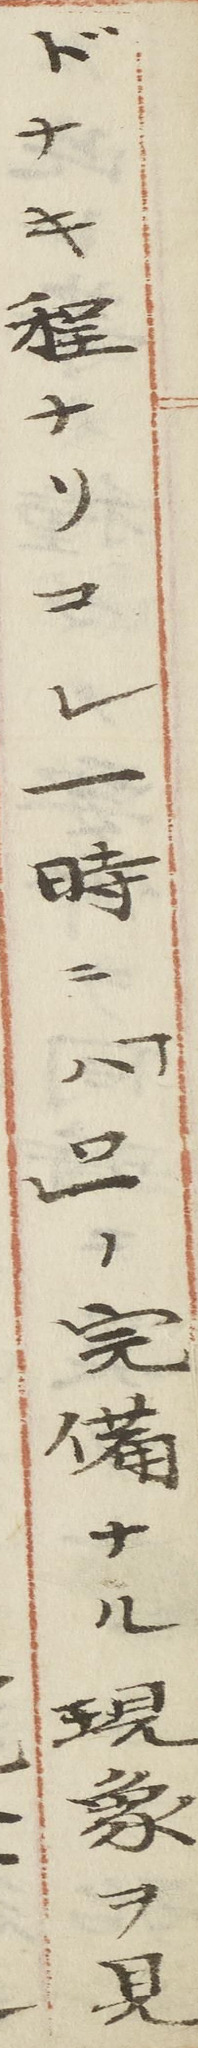ドナキ程ナリコレ一時ニ「ハロ」ノ完備ナル現象ヲ見
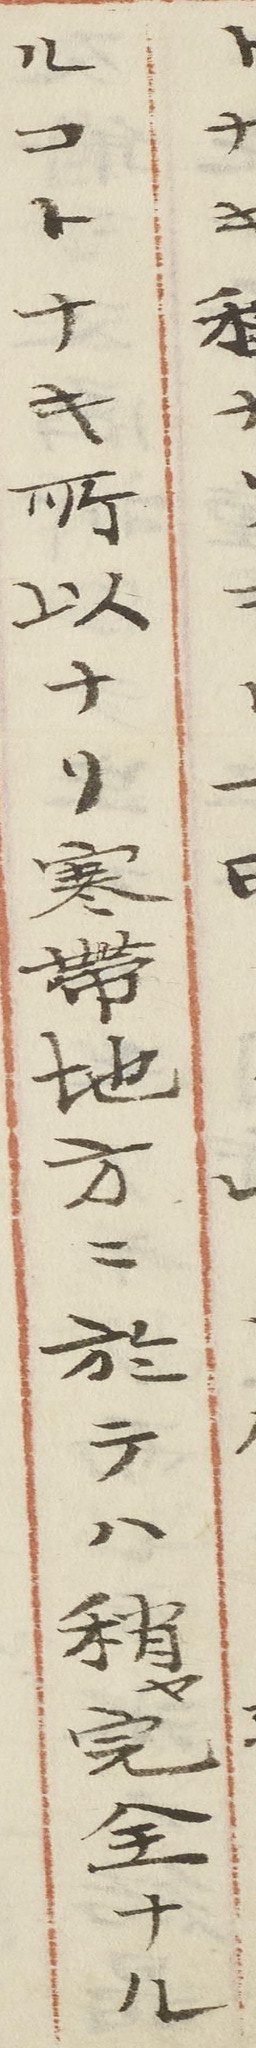ルコトナキ所以ナリ寒帯地方ニ於テハ稍ヤ完全ナル
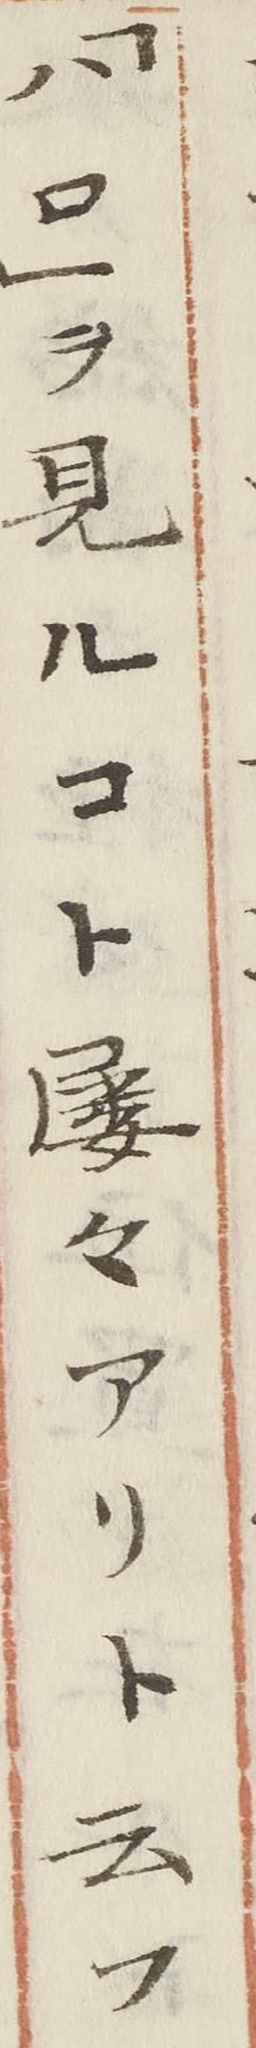「ハロ」ヲ見ルコト屡々アリト云フ
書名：虹及ハロノ説明
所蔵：東京大学地震研究所図書室 Earthquake Research Institute Library, The University of Tokyo, JAPAN
